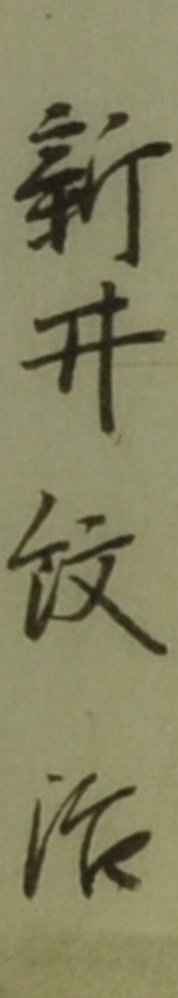新井紋治
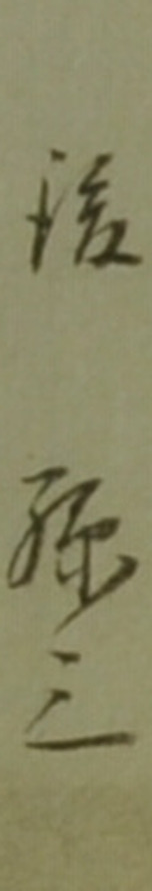後孫三
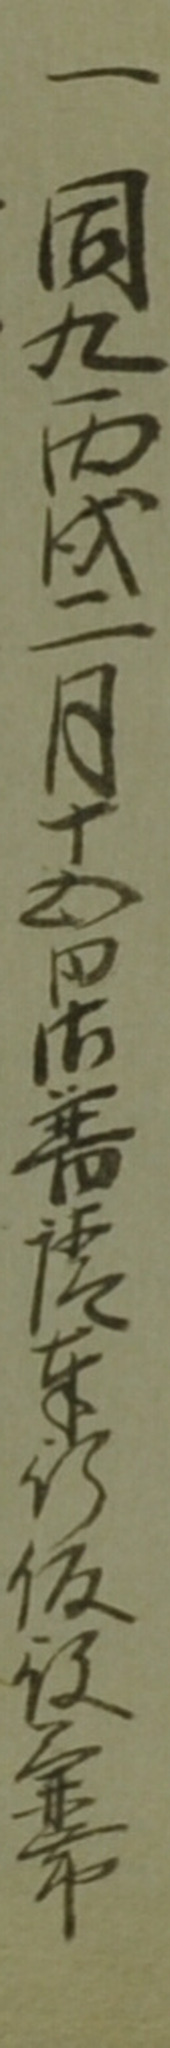一同九丙戌二月十五日御普請奉行仮役兼帯
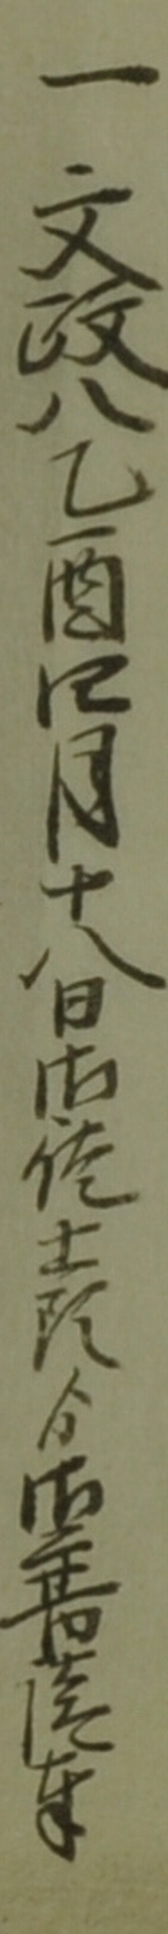一文政八乙酉四月十八日御徒士頭ゟ御普請奉
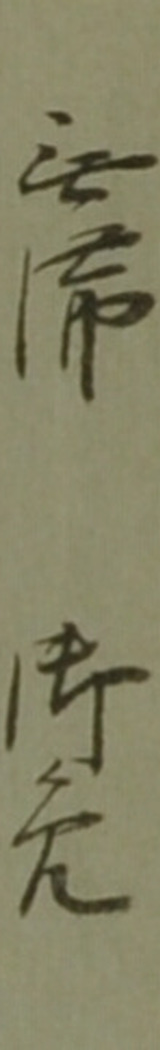無滞御免
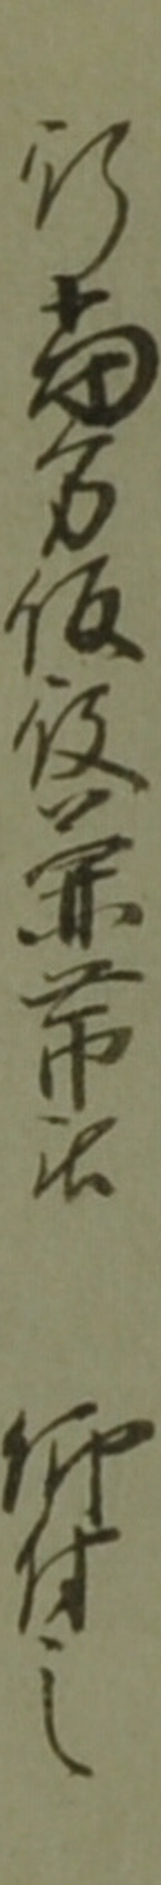行当分仮役兼帯被害仰付之
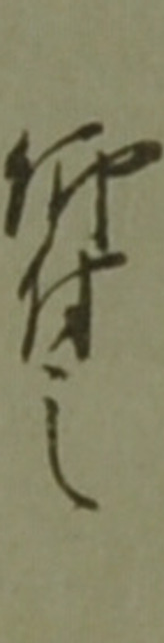仰付之
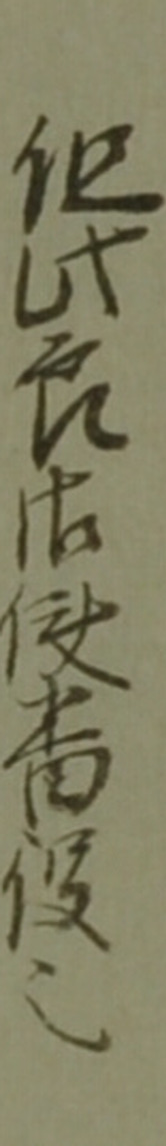但此節御使番役也
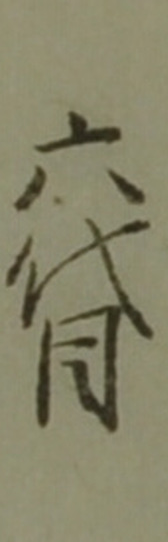六代目
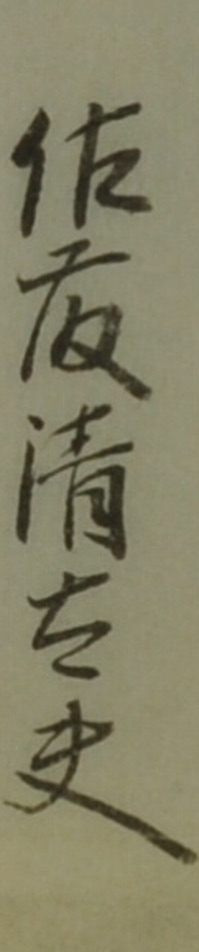佐藤清太夫
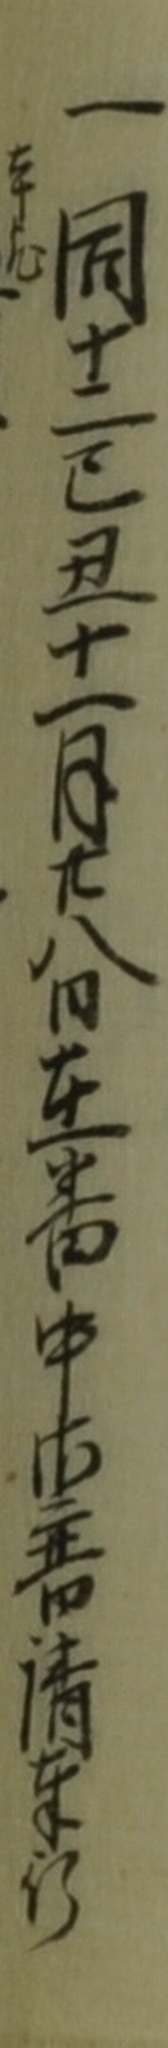一同十二己丑十一月廿八日在番中御普請奉行
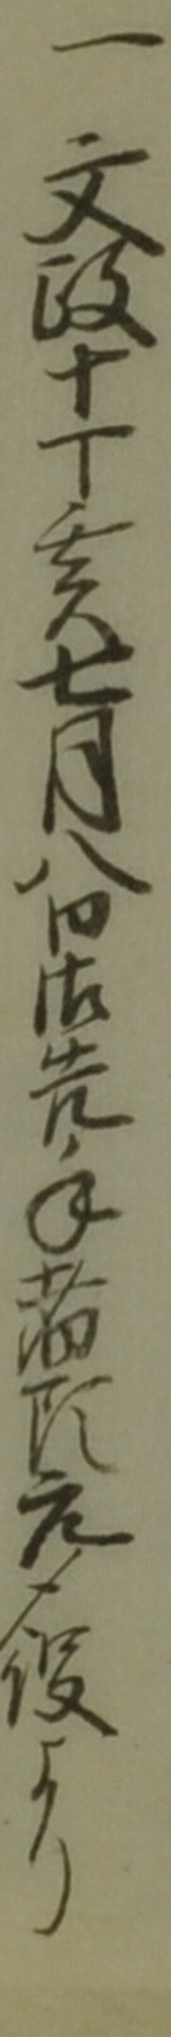一文政十丁亥七月八日御先手者頭元〆役より
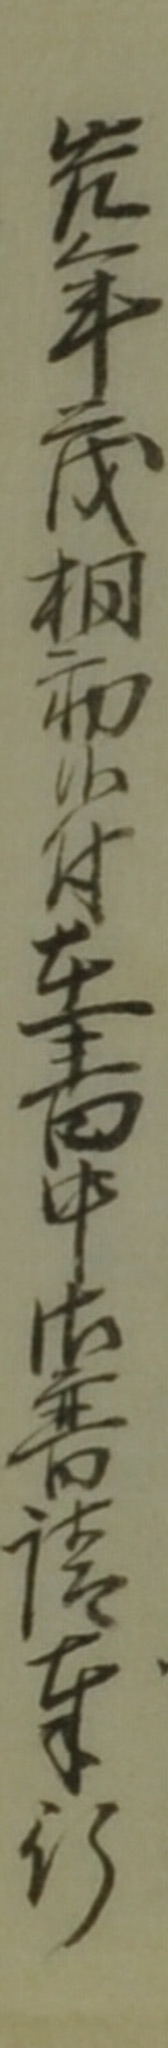先年茂相勤候付在番中御普請奉行
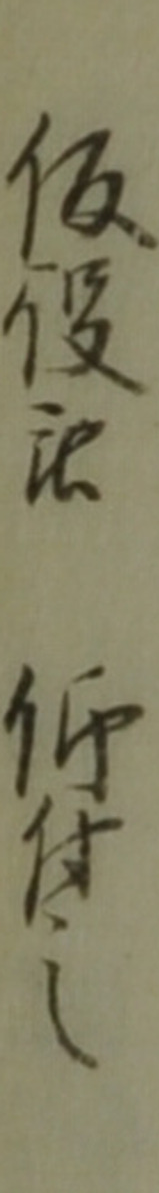仮役被仰付之
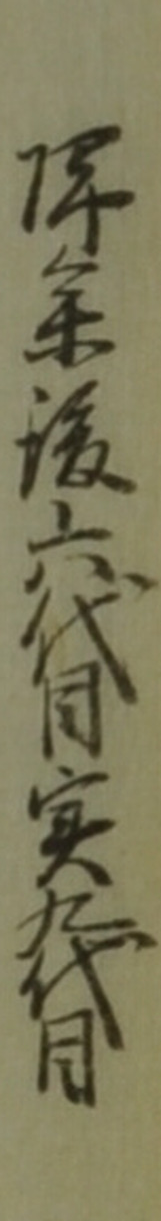帰参後六代目実九代目
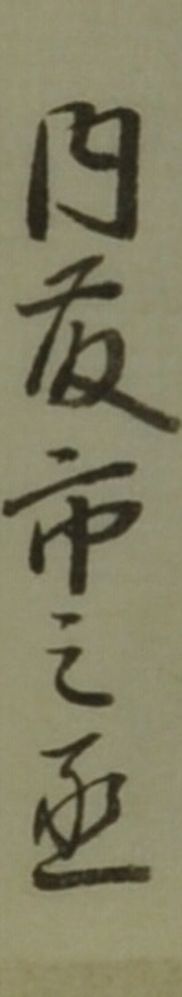内藤市之丞
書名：諸御役代々録（六）
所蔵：伊那市立高遠町図書館・合同会社AMANE
